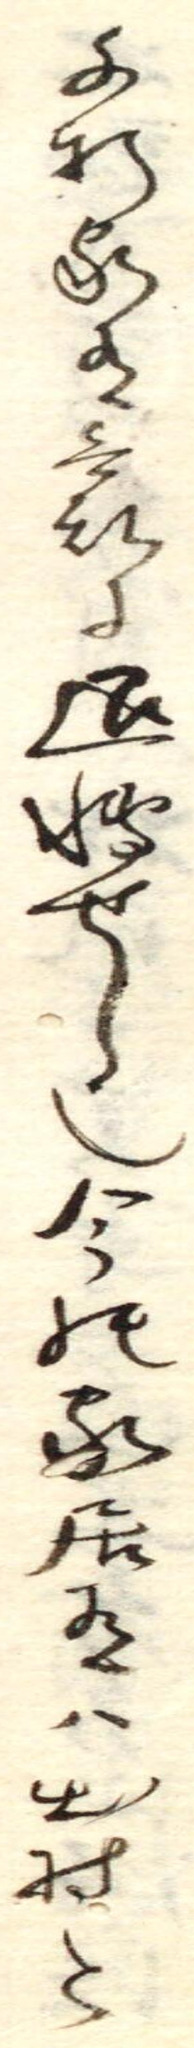千軒家有兵乱に退転せし也今の家居は出村と
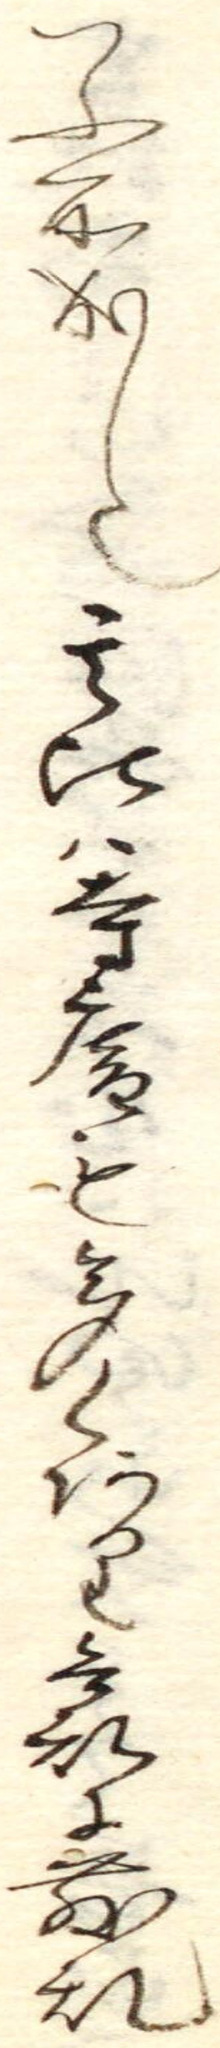いふ所成し也其比は寺庵も多くあり兵乱に散乱
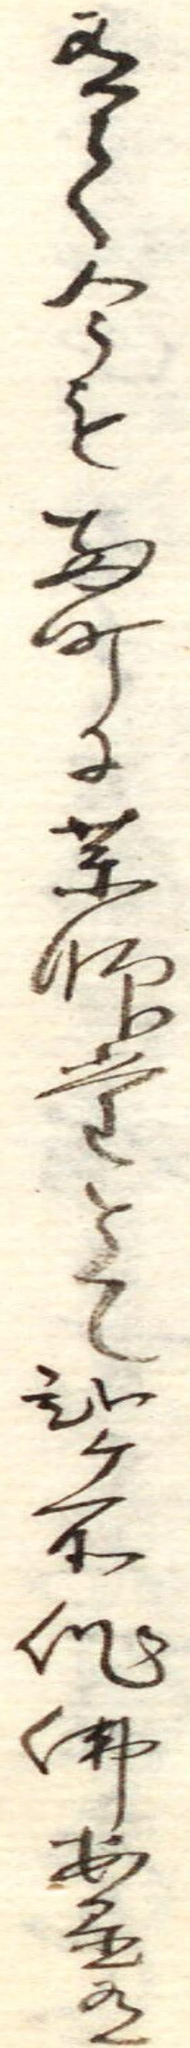有て今も両町に薬師堂とて弐ヶ所作仏安置有
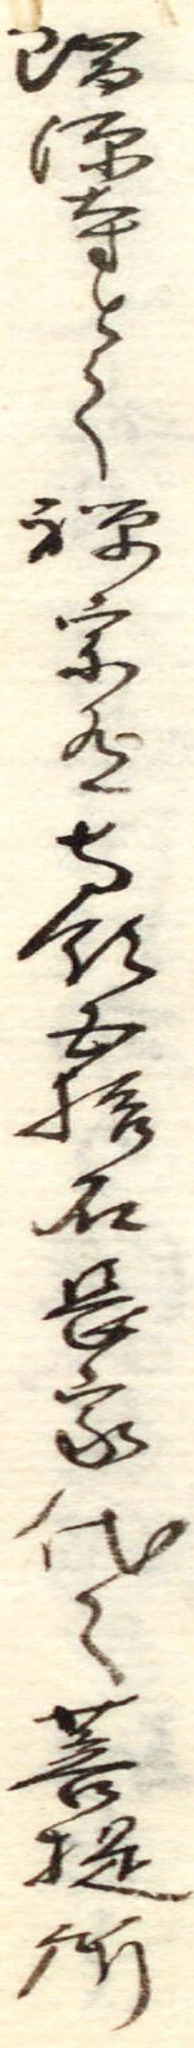瑞源寺とて禅宗有寺領五拾石長家代々菩提所
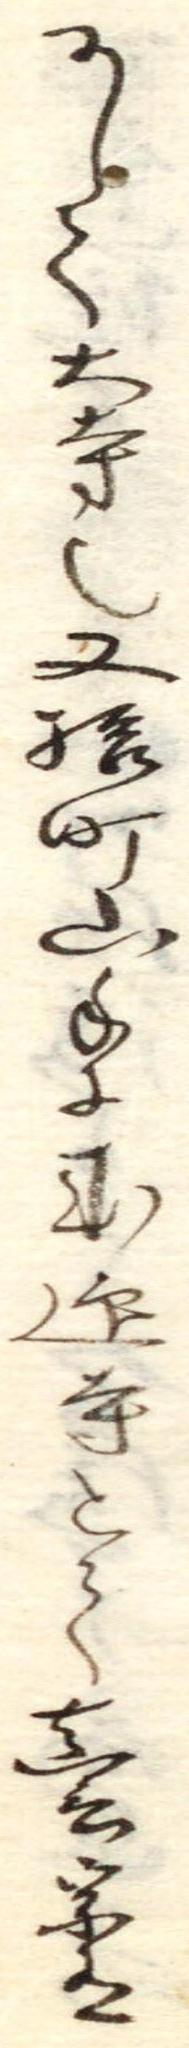にて大寺也又拾町山手に来迎寺とて真言宗有
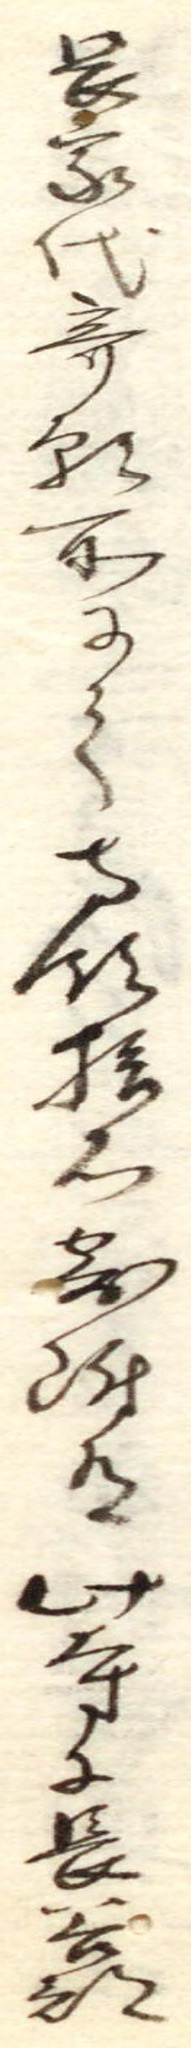長家代奇願所にて寺領拾石寄附有此寺に長谷部
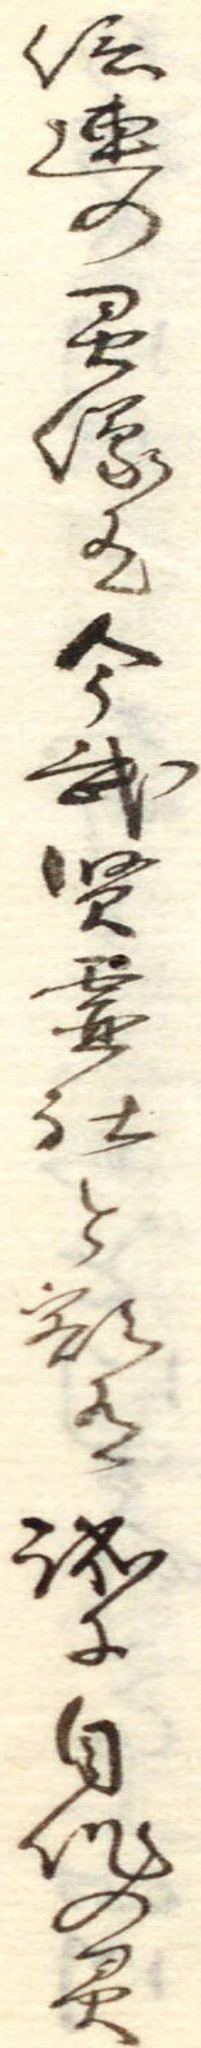信連の霊像有今武賢霊社と額有誠に自作の霊
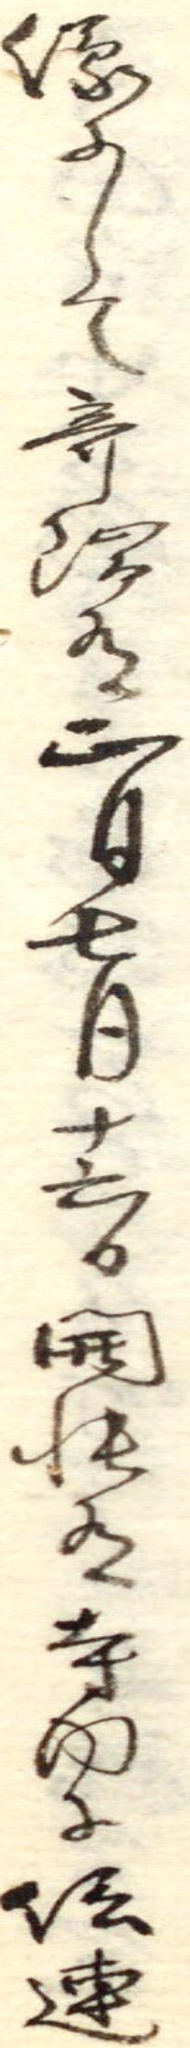像にて奇瑞有正月七月十六日開帳有寺内に信連
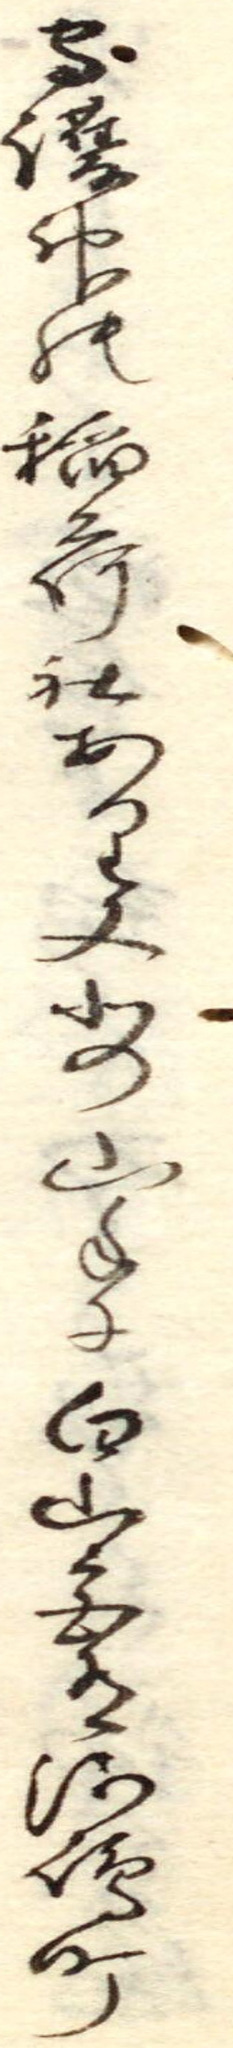守護神の稲荷社あり又北の山手の白山宮有河嶋町
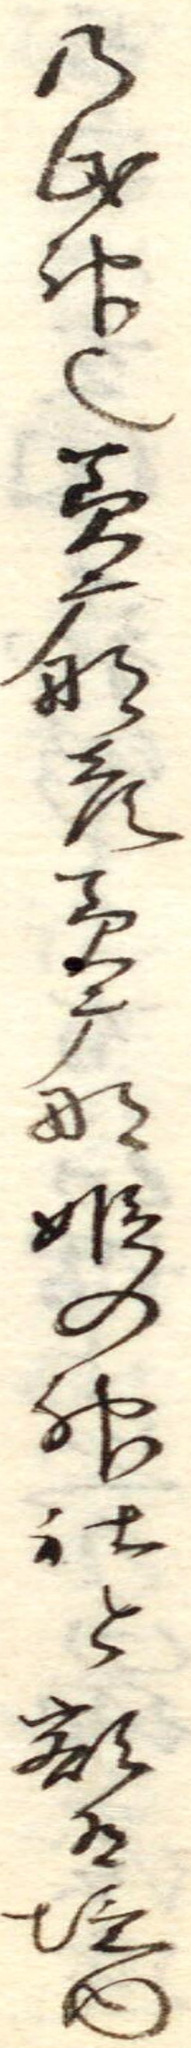の氏神也美馬那彦美麻那姫の神社と額有境内
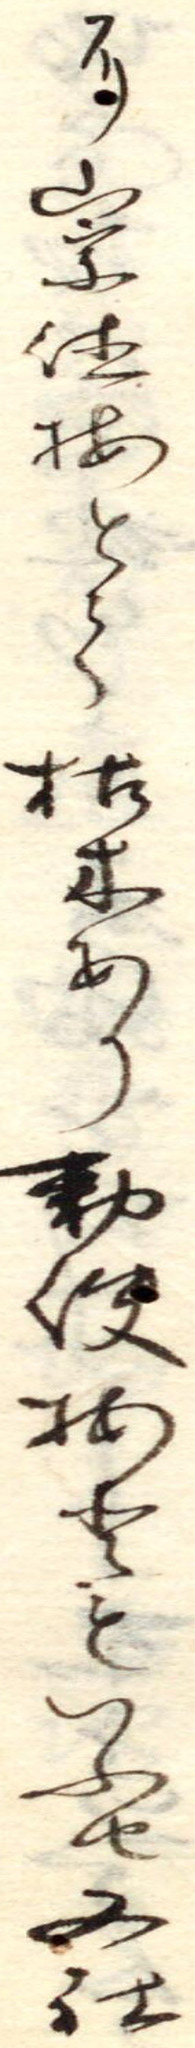に崇徳梅とて枯木あり勅使梅ともいふ由又社
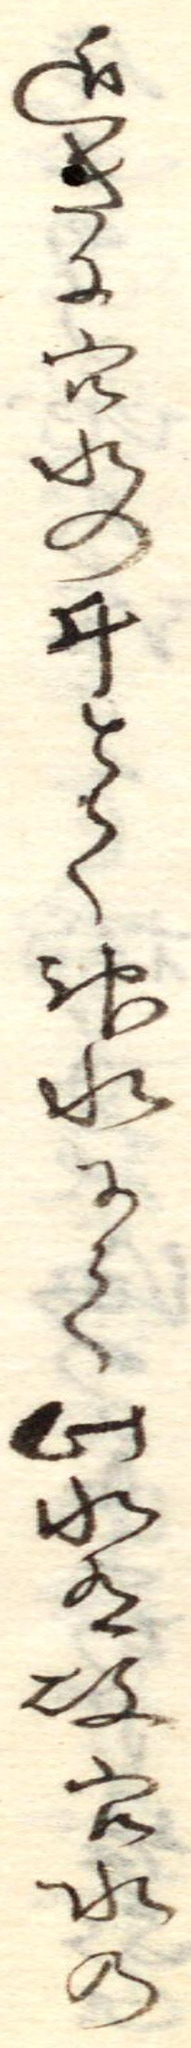近きに穴水の井とて神水にて此水有故穴水の
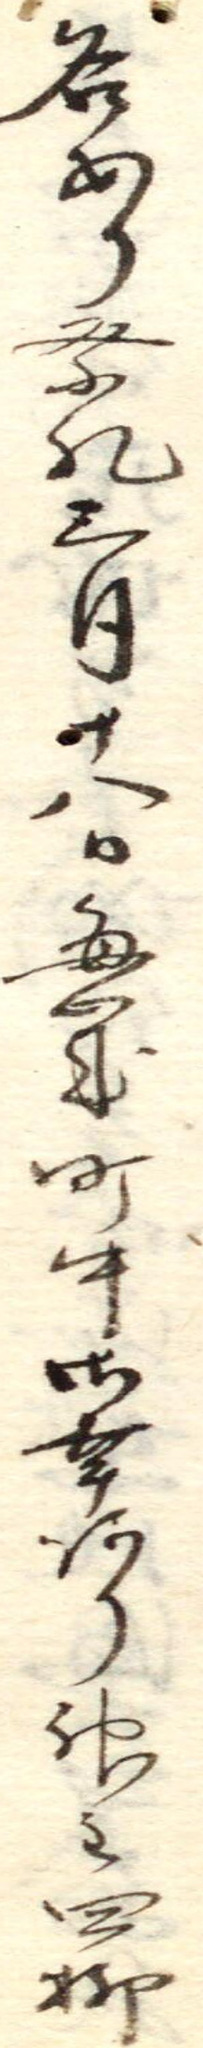名あり祭礼三月廿八日毎歳町中御幸あり神主四柳
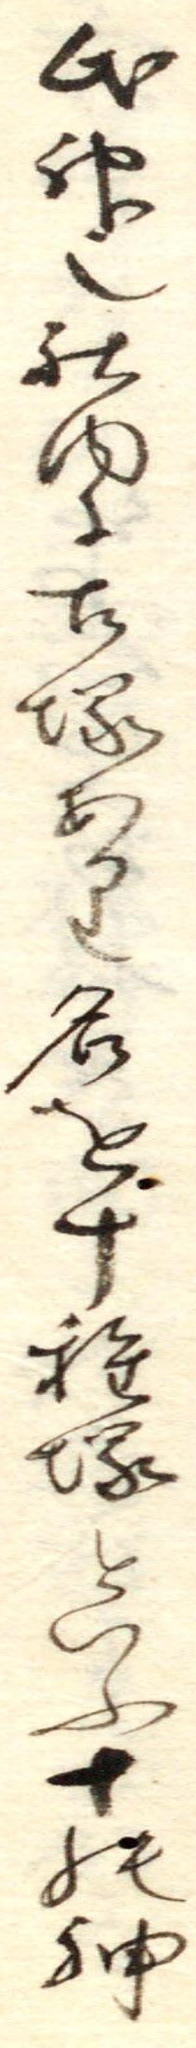氏也社内に古塚あり名を十種塚といふ十の神
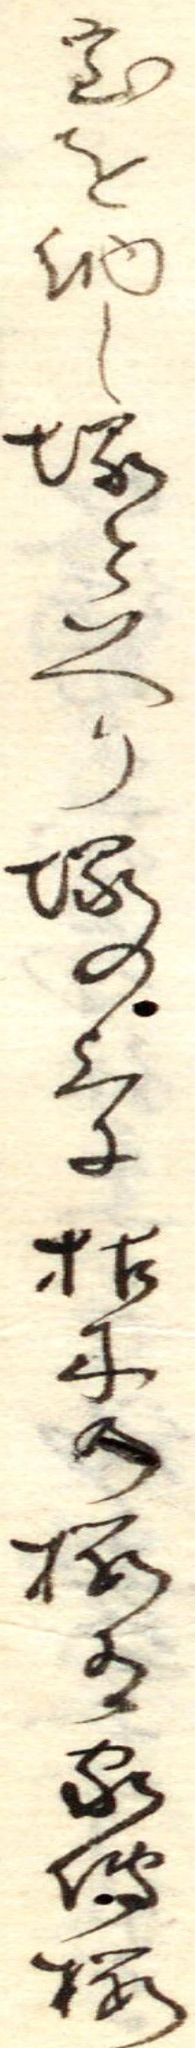宝を納氏し塚といへり塚の上に枯木の桜有家伝桜
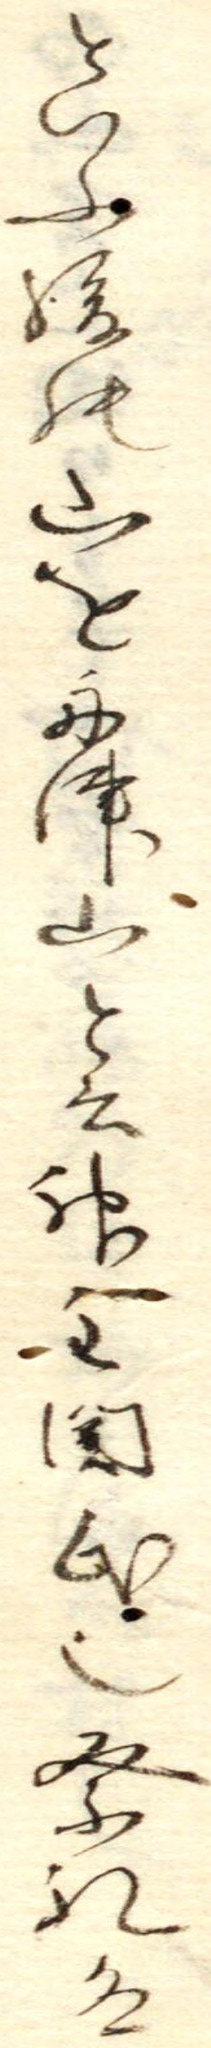といふ後の山を舟津山と云神主関氏也祭礼は
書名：能登名跡誌
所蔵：Ishikawa Prefectural Library
